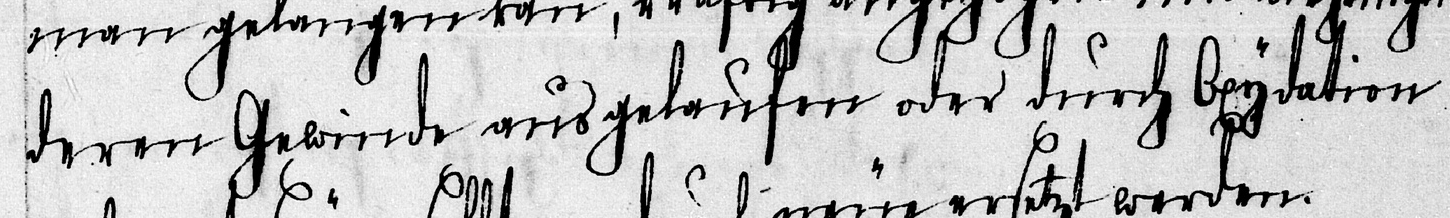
deren Gewinde ausgelaufen oder durch Oxydation
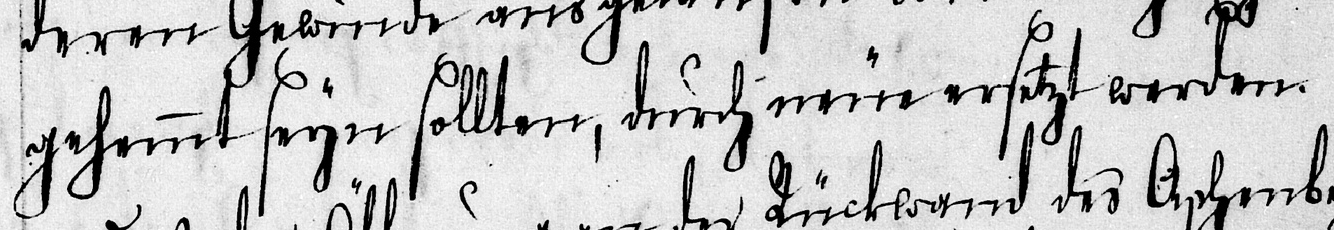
gehemmt seyn sollten, durch neue ersetzt werden.
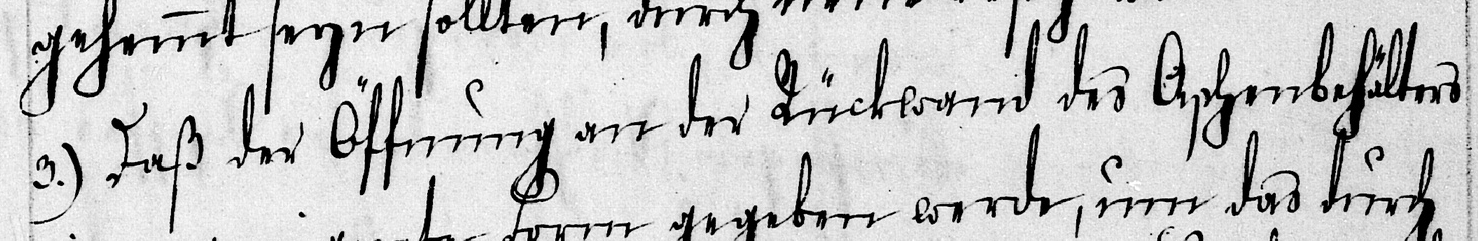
3.) Daß der Öffnung an der Rückwand des Aschenbehälters
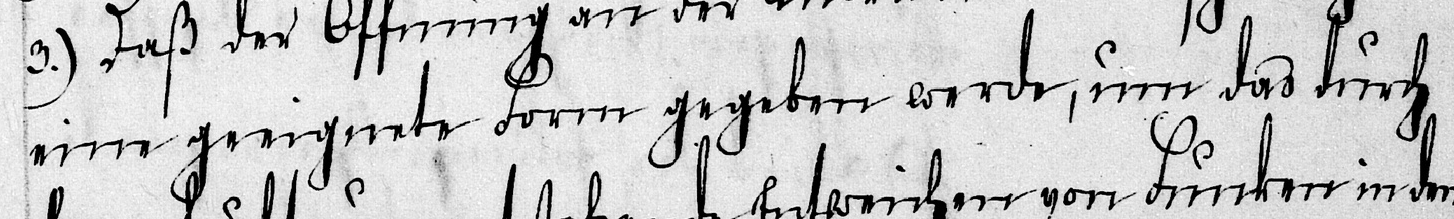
eine geeignete Form gegeben werde, um das durch
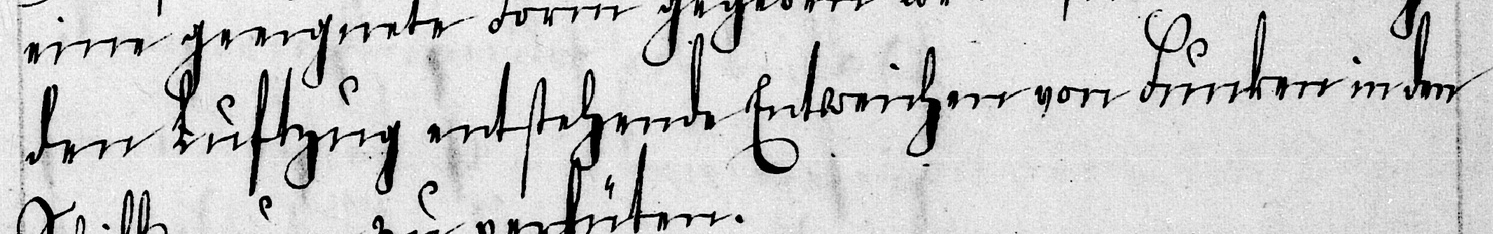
den Luftzug entstehende Entweichen von Funken in den
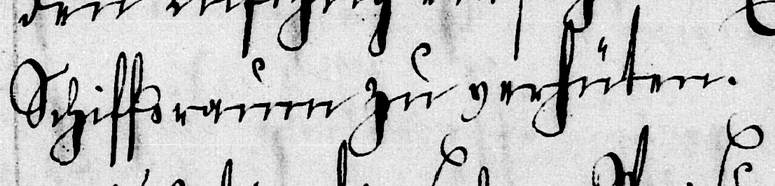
Schiffsraum zu verhüten.
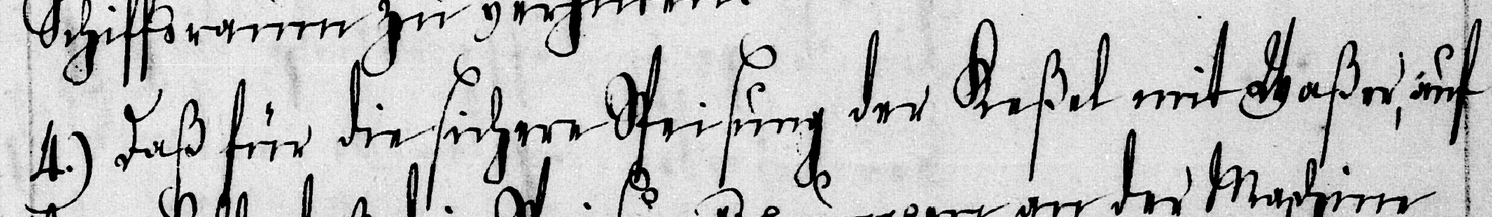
4.) Daß für die sichere Speisung der Keßel mit Waßer, auf
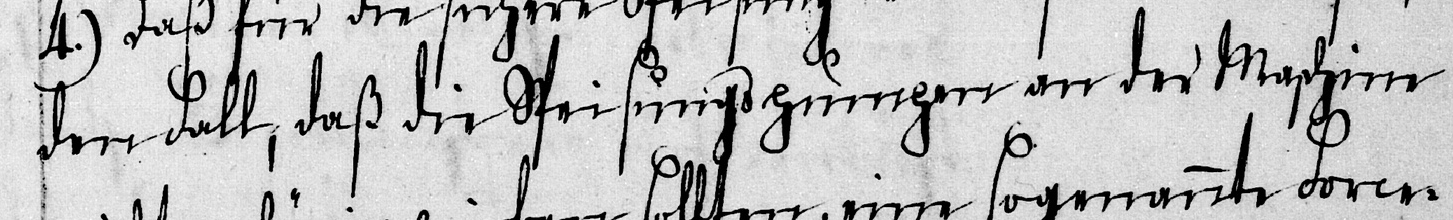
den Fall, daß die Speisungspumpen an der Maschine
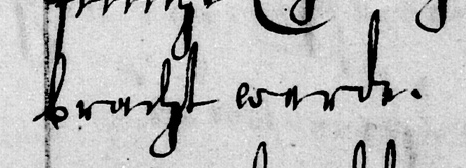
bracht werde.
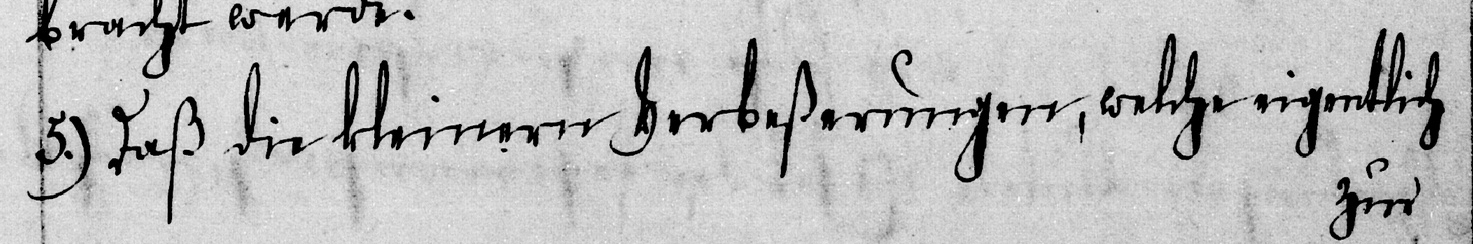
5.) Daß die kleinern Verbeßerungen, welche eigentlich
